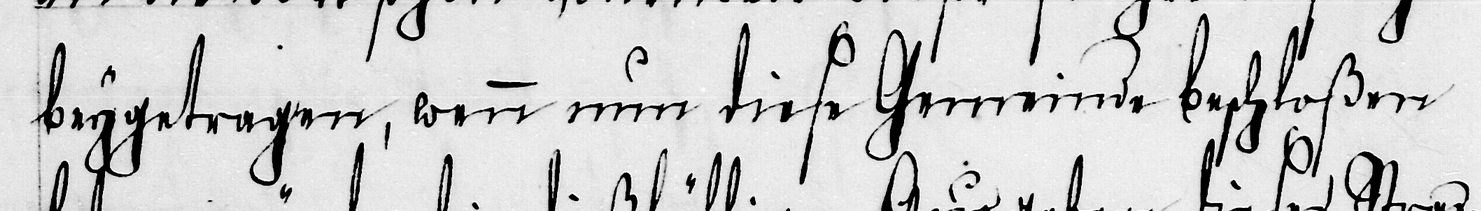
beygetragen, wenn nun diese Gemeinde beschloßen
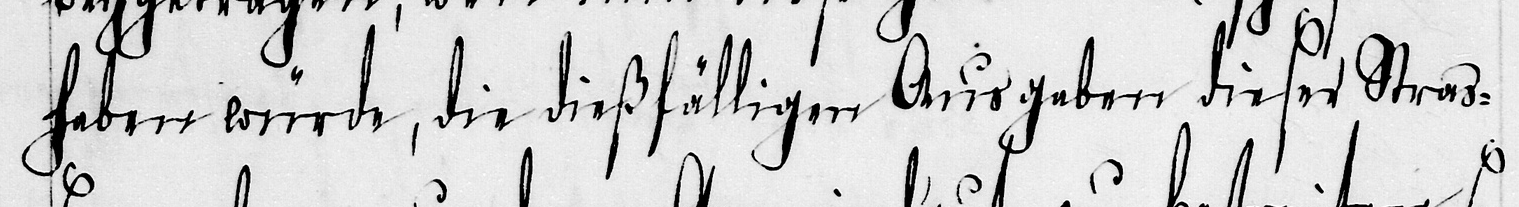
haben würde, die dießfälligen Ausgaben dieser Straß¬
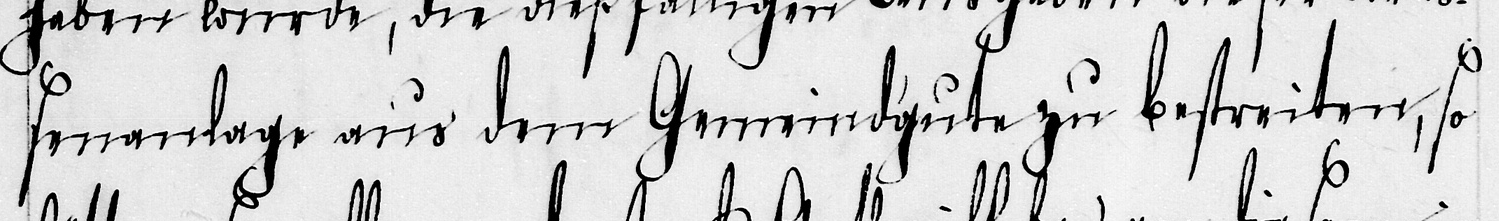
enanlage aus dem Gemeindgute zu bestreiten, so
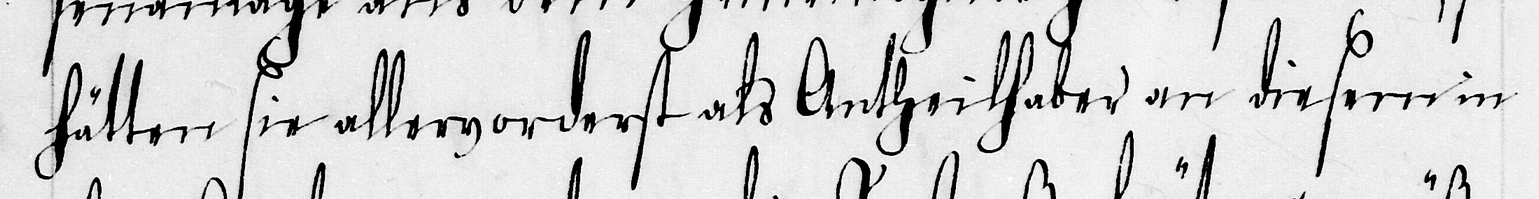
hätten sie allervorderst als Antheilhaber an diesem in
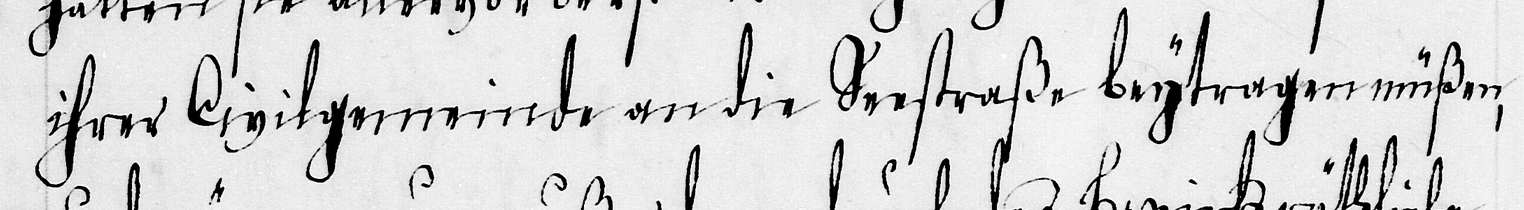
ihrer Civilgemeinde an die Seestraße beytragen müßen,
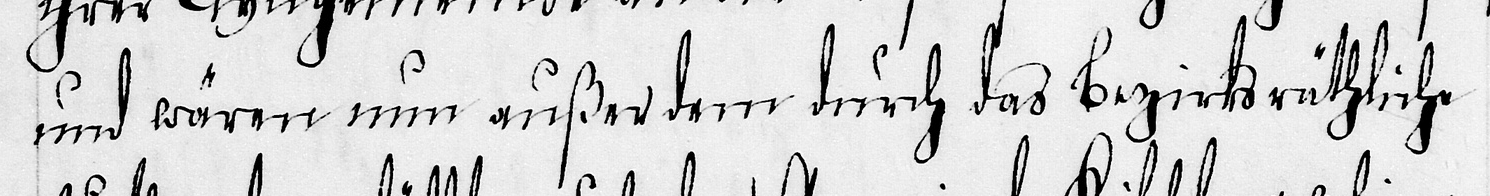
und wären nun außerdem durch das Bezirksräthliche
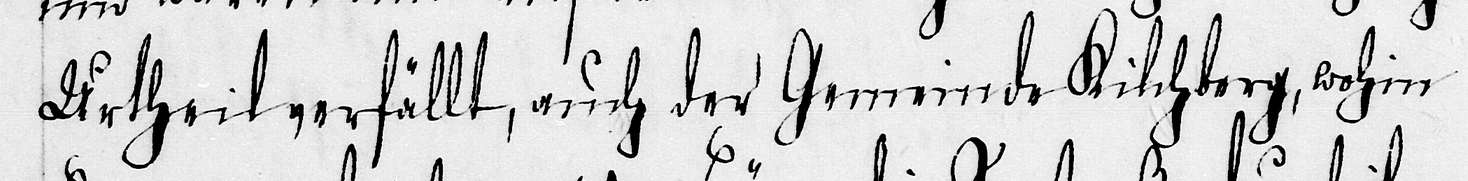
Urtheil verfällt, auch der Gemeinde Kilchberg, wohin
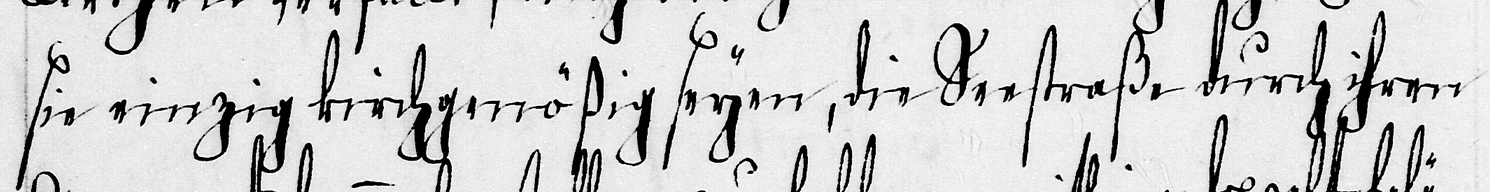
sie einzig kirchgenößig seyen, die Seestraße durch ihren
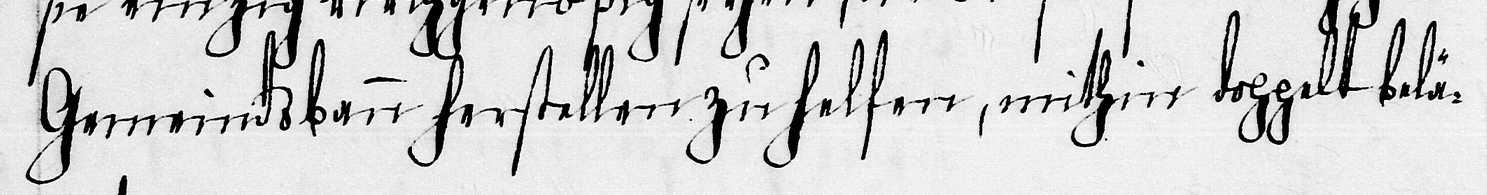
Gemeindsbann herstellen zu helfen, mithin doppelt bel¬
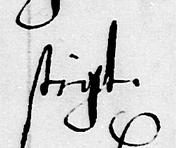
stigt.
